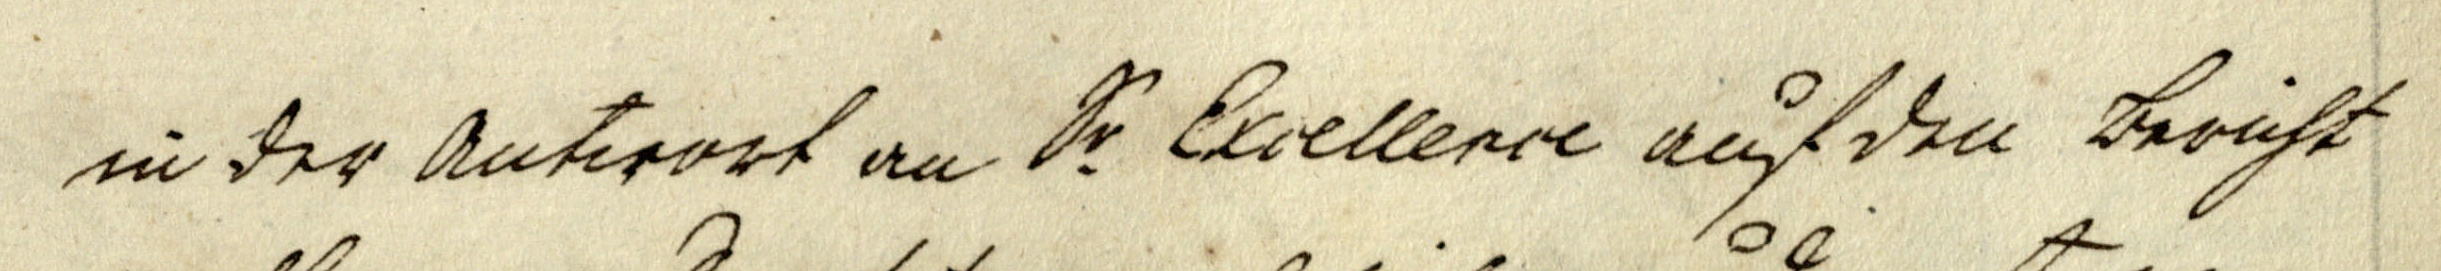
in der Antwort an Sr Excellence auf den Bericht
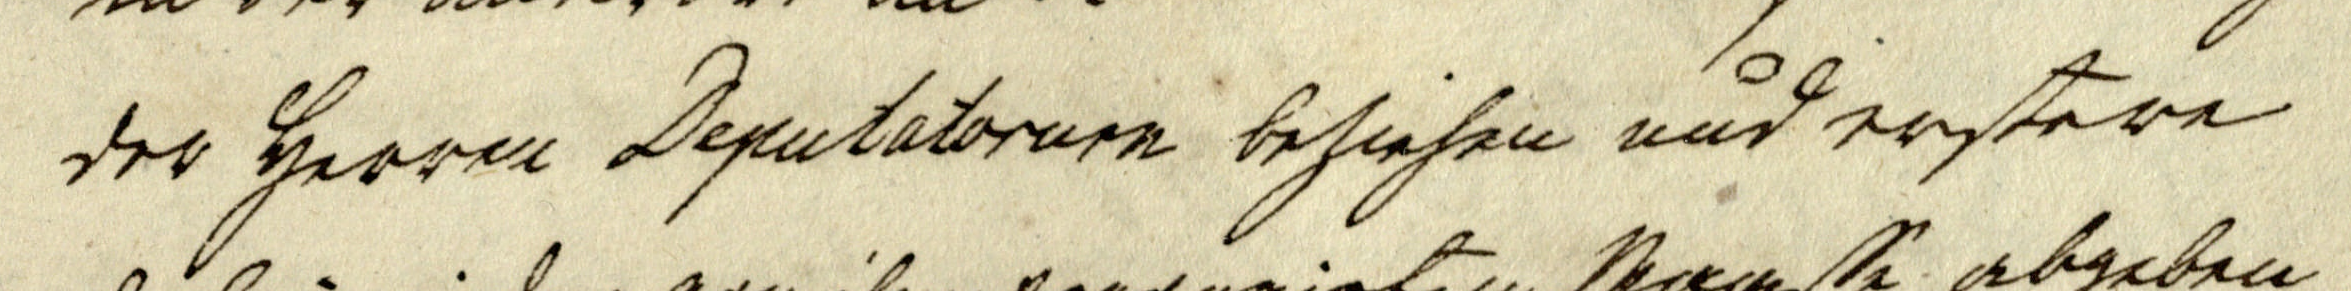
der Herren Deputatorum beziehen und erstere
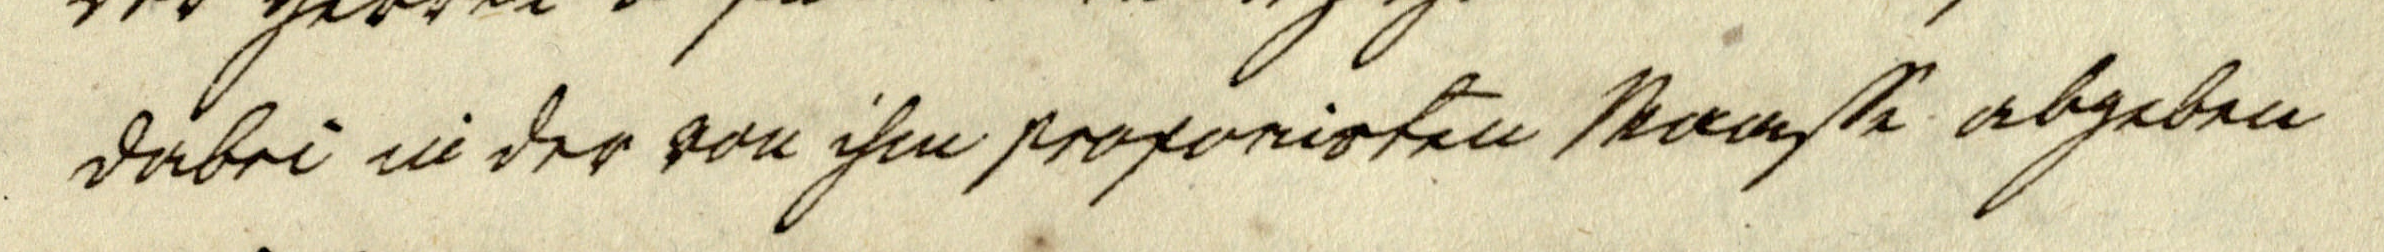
dabei in der von ihm proponirten Maasse abgeben
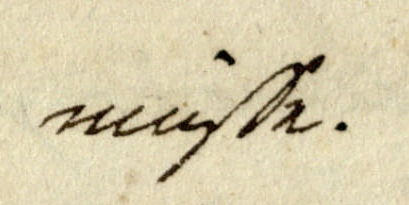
müsse.
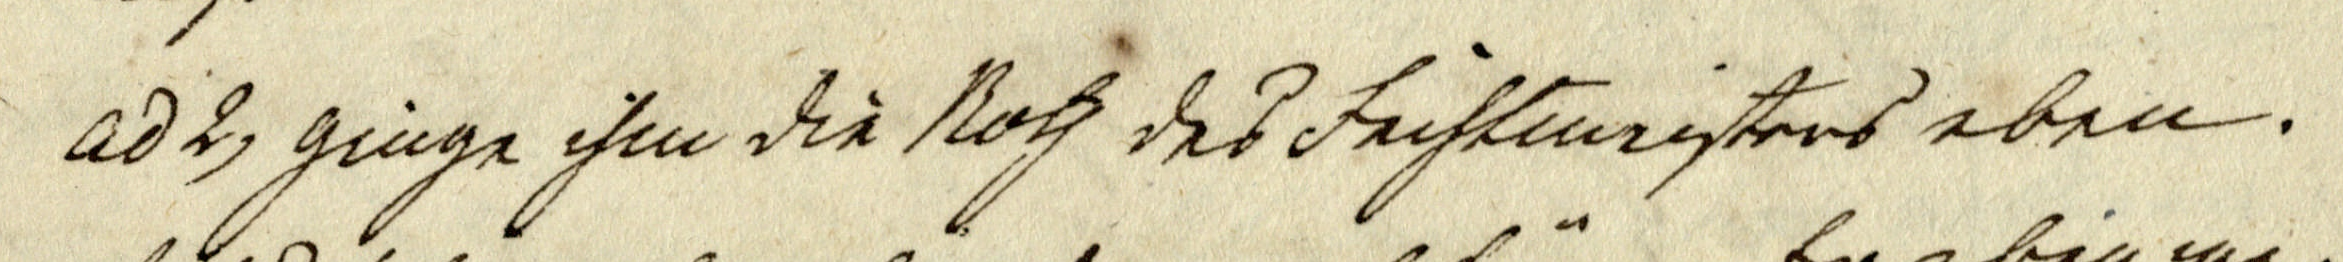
ad 2., ginge ihm die Noth des Fechtmeisters eben¬
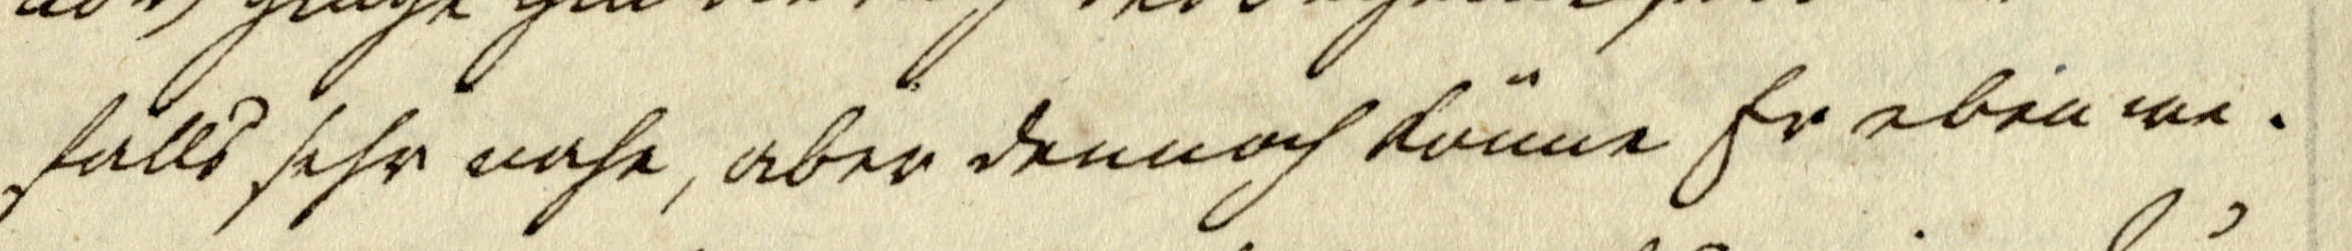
falls sehr nahe, aber dennoch könne Er ebenwe¬
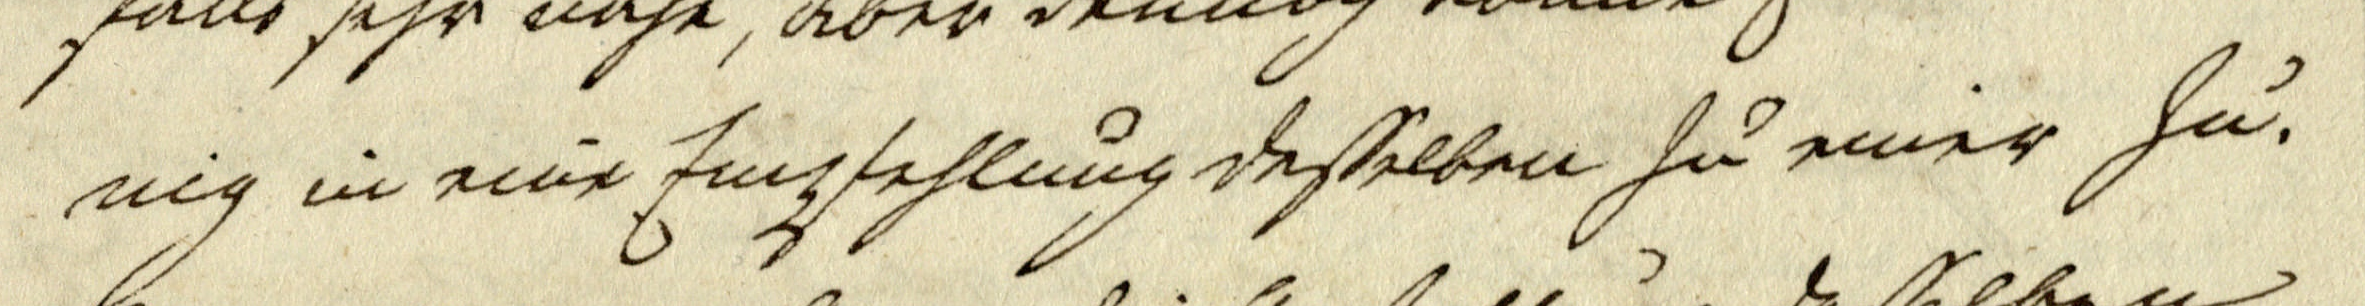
nig in eine Empfehlung desselben zu einer Zu¬
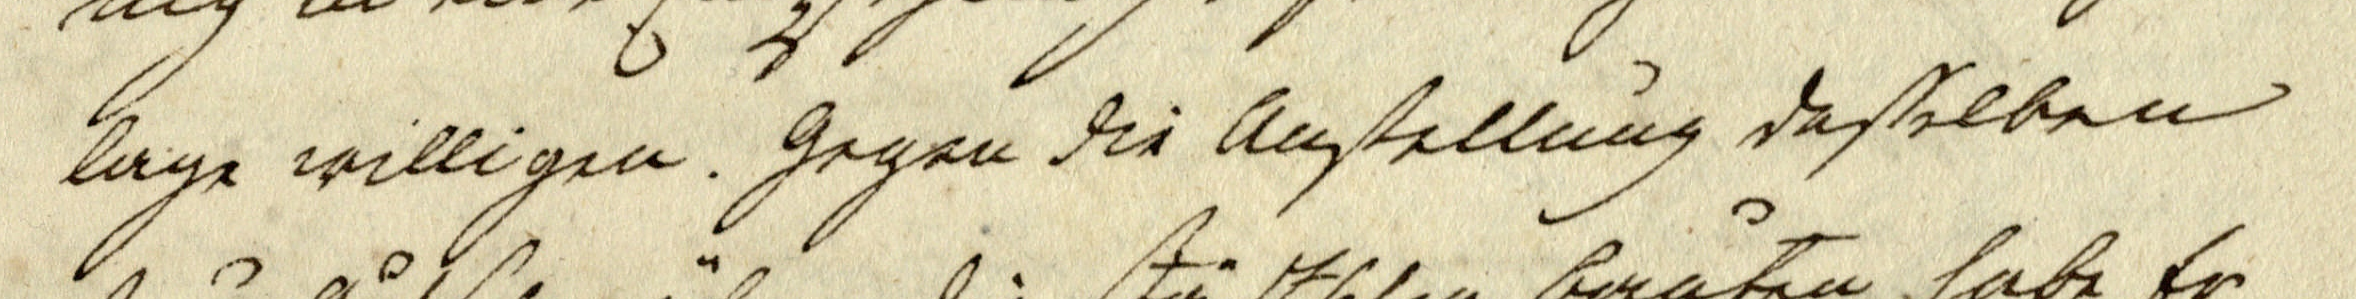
lage willigen. Gegen die Anstellung desselben
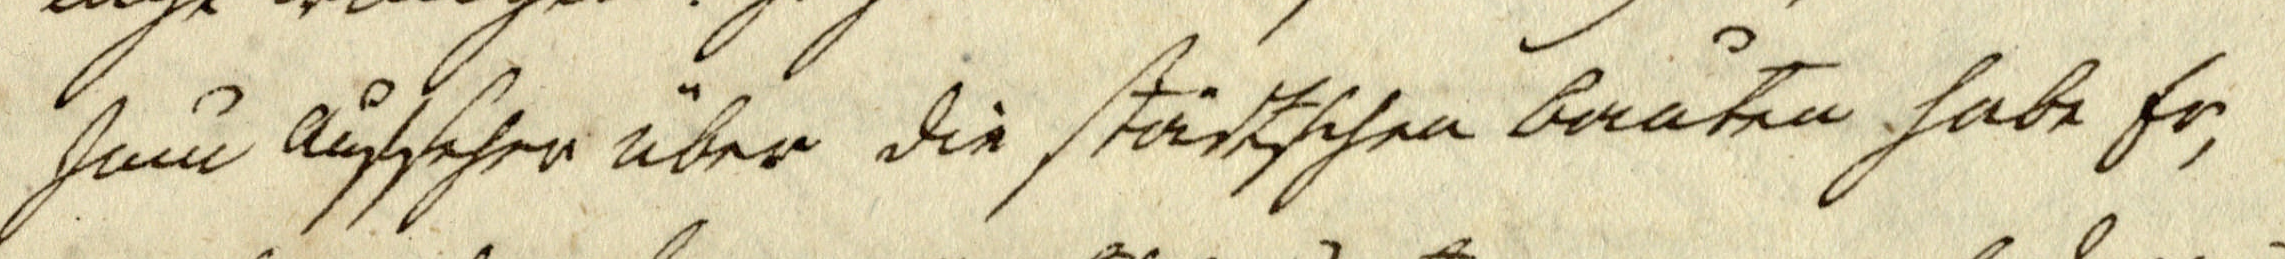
zum Aufseher über die städtschen Bauten habe Er,
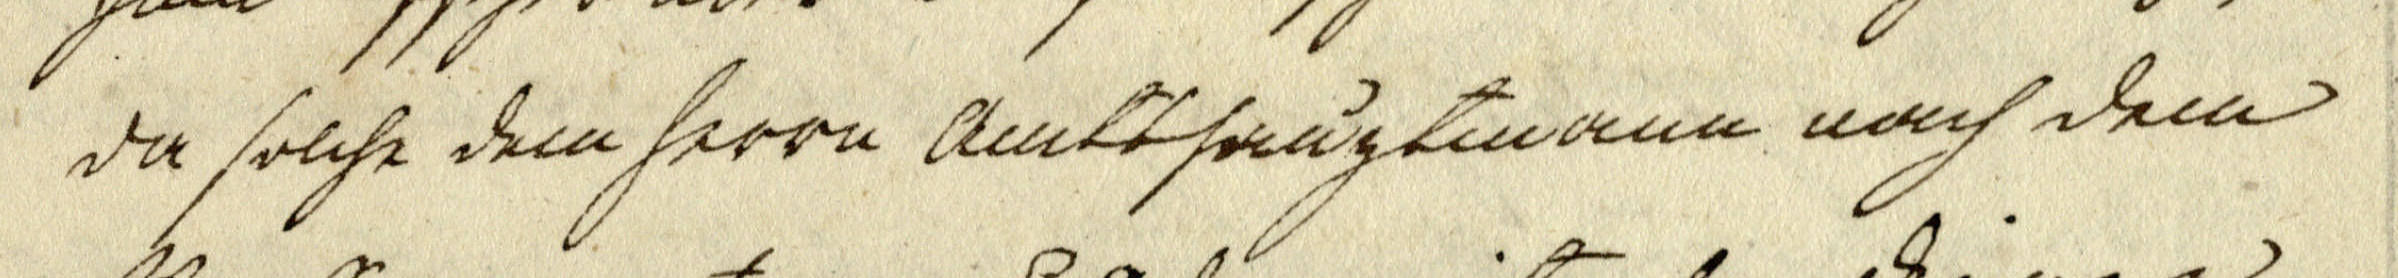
da solche dem Herrn Amtshauptmann nach dem
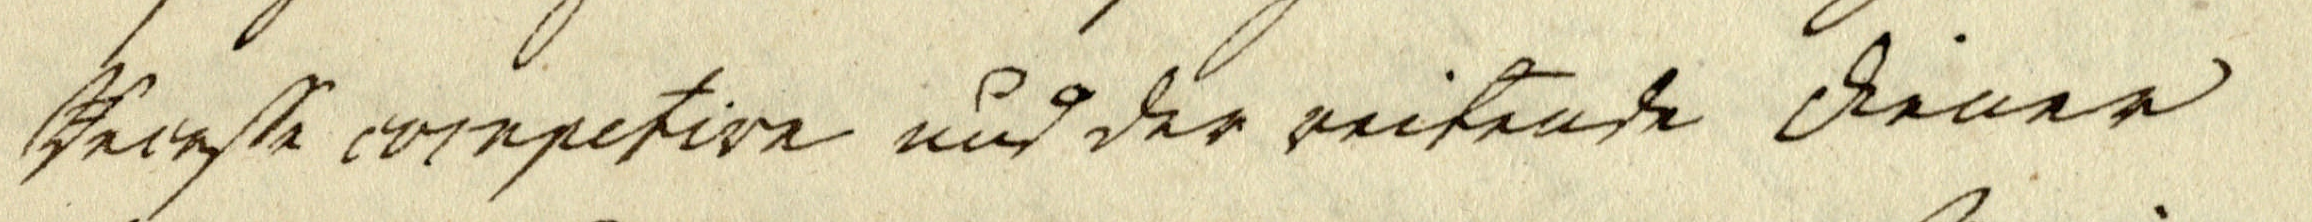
Recesse competire und der reitende Diener
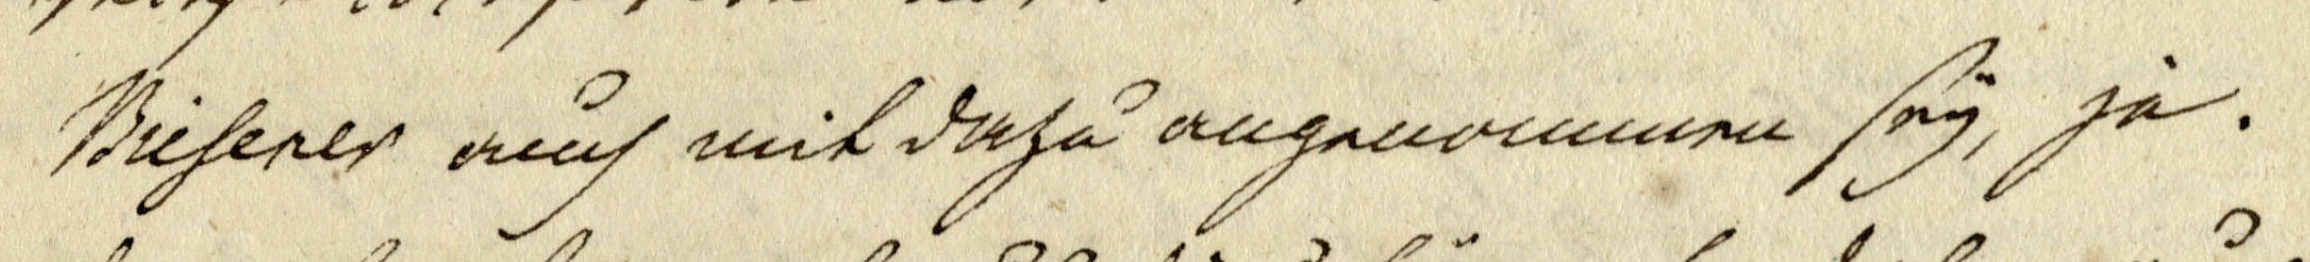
Biesener auch mit dazu angenommen seÿ, je¬
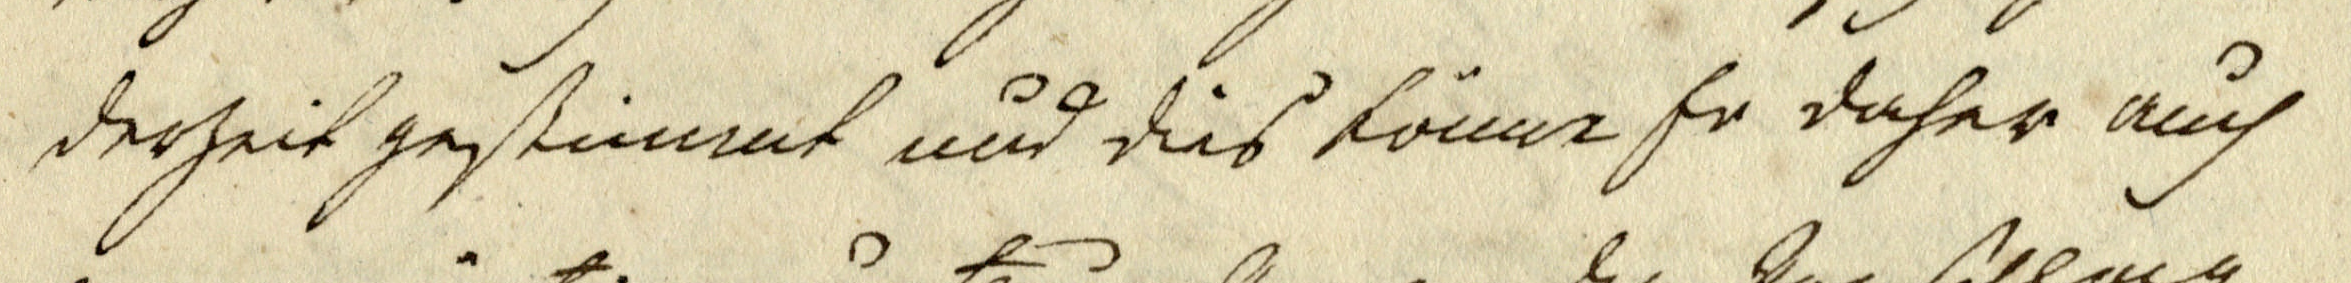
derzeit gestimmt und dies könne Er daher auch
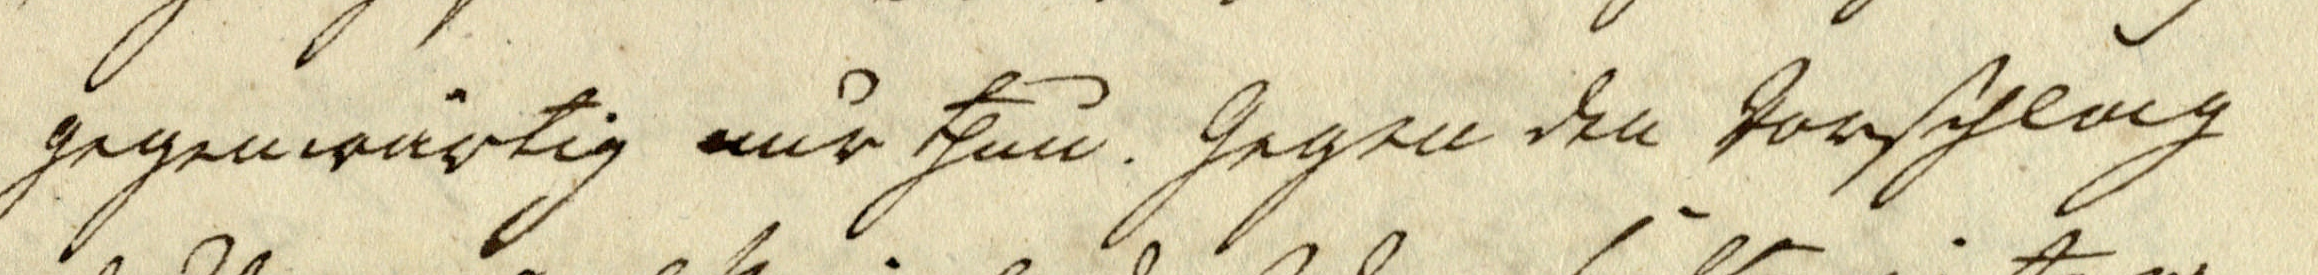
gegenwärtig nur thun. Gegen den Vorschlag
